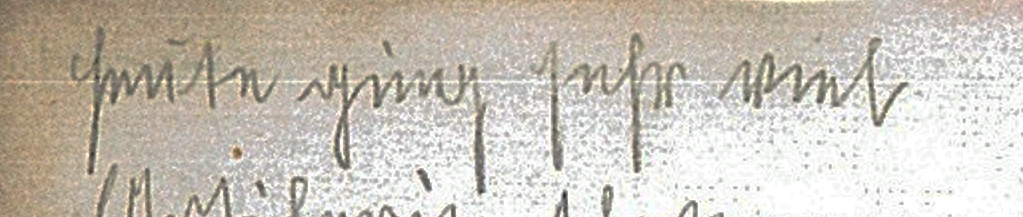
Heute ging sehr viel
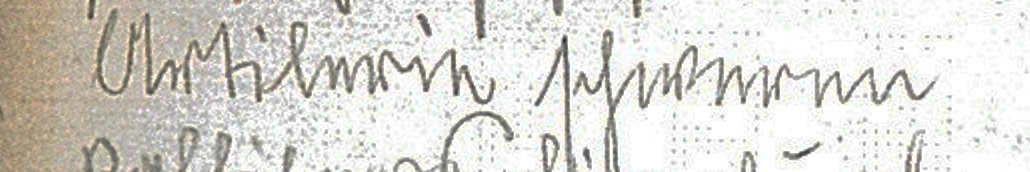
Artilerie schweren
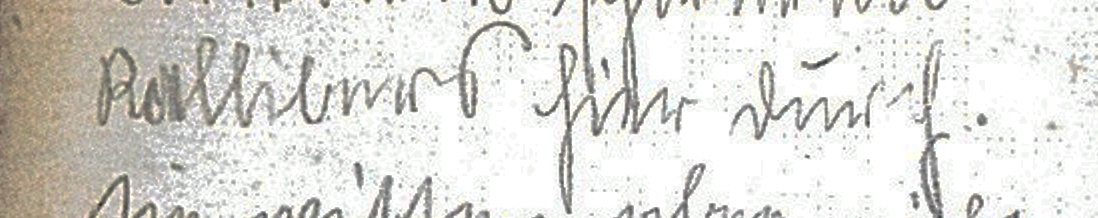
Kallibers hier durch.
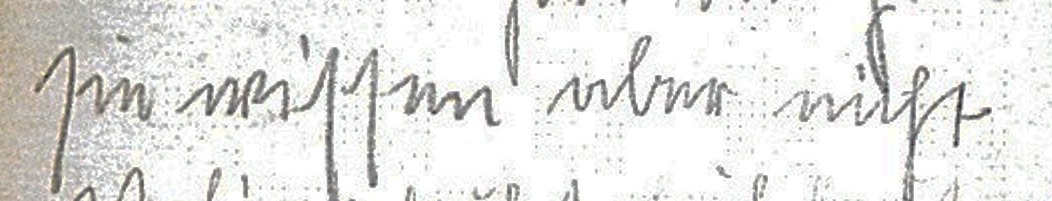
Sie wissen aber nicht
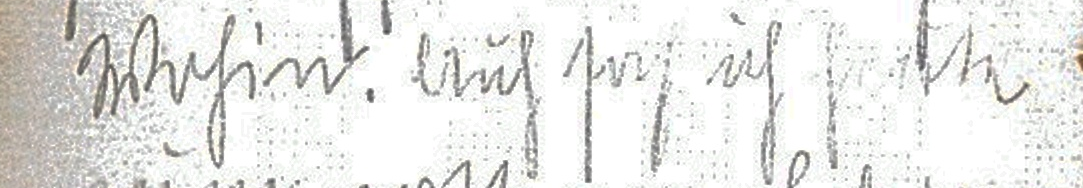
wohin. Auch sah ich heute
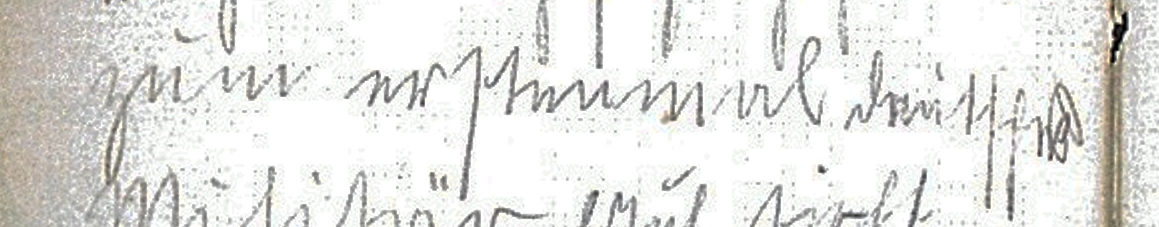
zum erstenmal deutlich
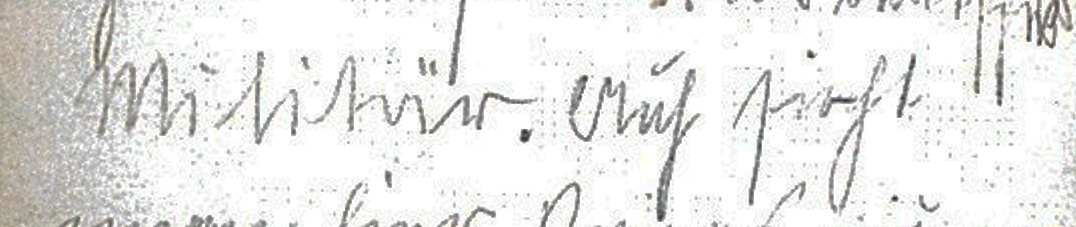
Militär. Auch sieht
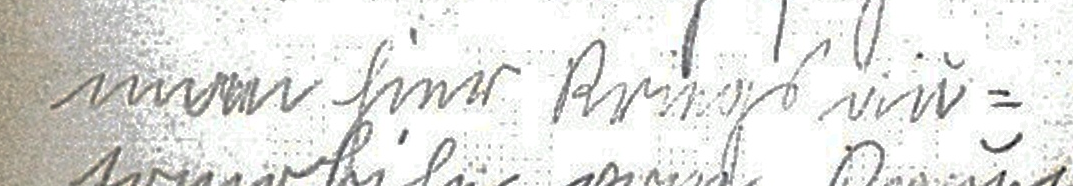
man hier Kriegsau-
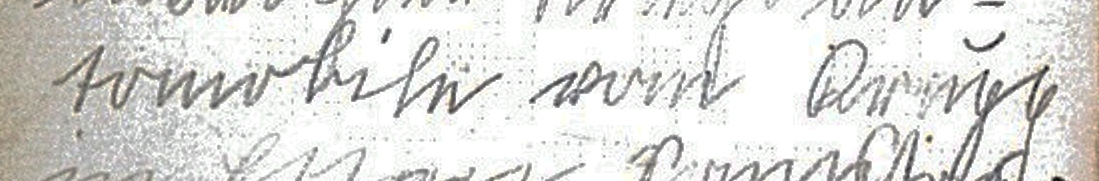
tomobile vom Kriegg
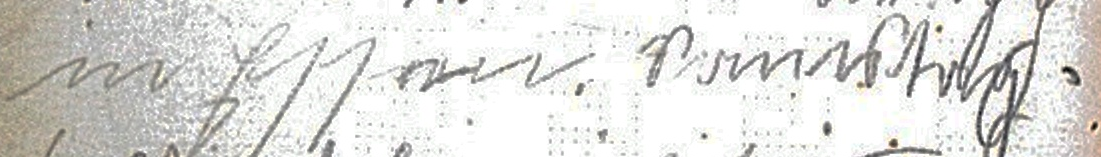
iness. Samstag
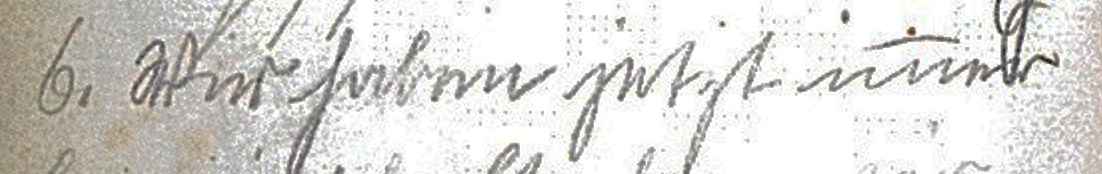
6. Wir haben jetzt immer
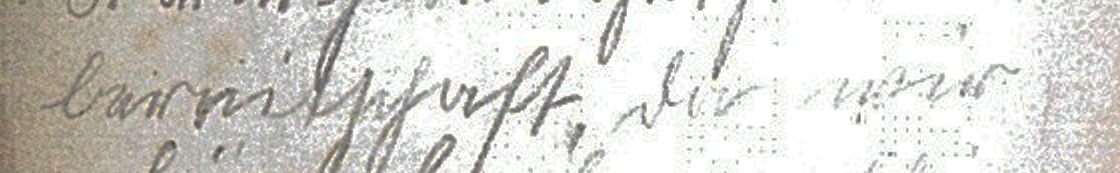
Bereitschaft, da wir
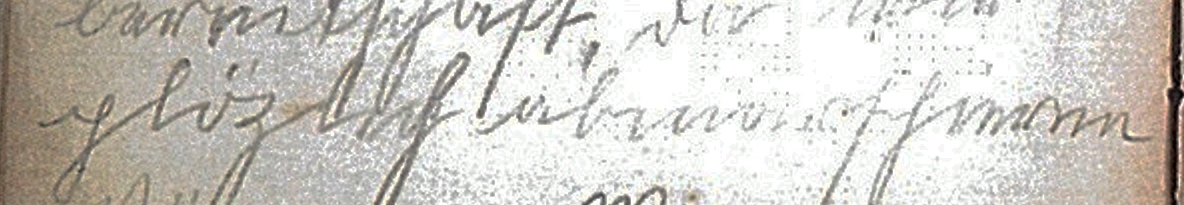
plözlich abmarschieren
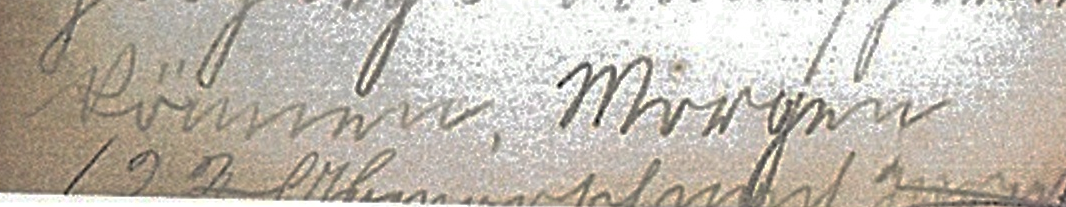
können. Morgen
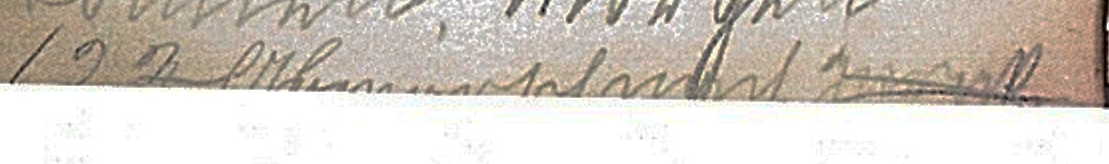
12 h Abmarsch nach
